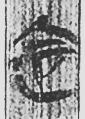定
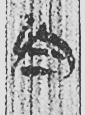於
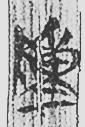陳
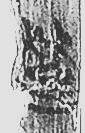楚
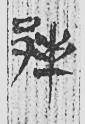邦
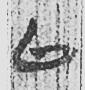㠯（以）
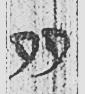多
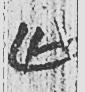亡
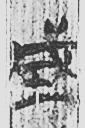城
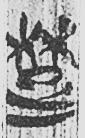楚
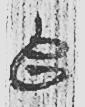𠂤
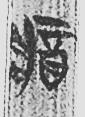𨟻
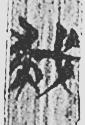{求戈}
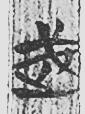武
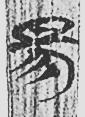昜
